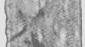五
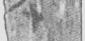十
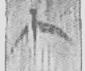六
